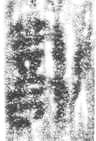猶
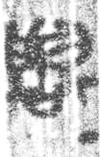○（譽）
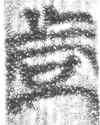者
